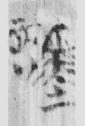{言墨}
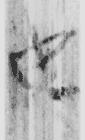𡚦
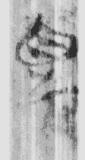見
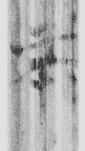不
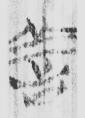善
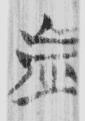者
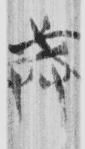戒
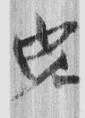𡚦
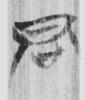君
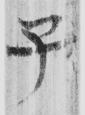子
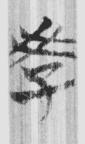𡥈
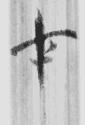才
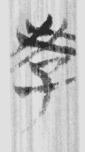𡥈
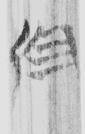於
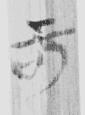可
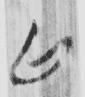㠯（以）
